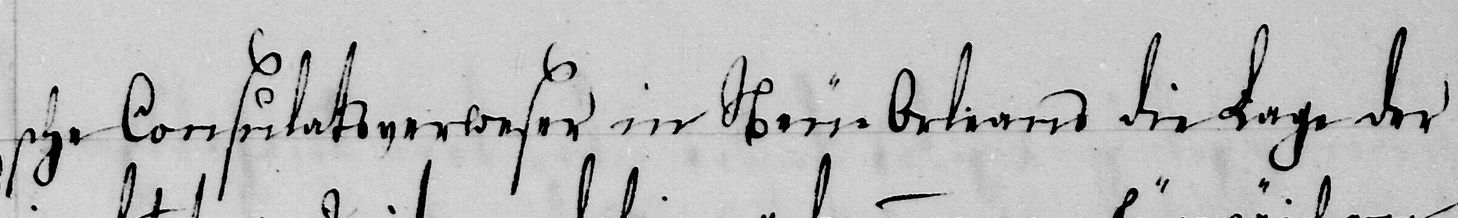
sche Consulatsverweser in Neu-Orleans die Lage der
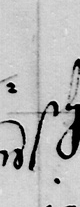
il¬
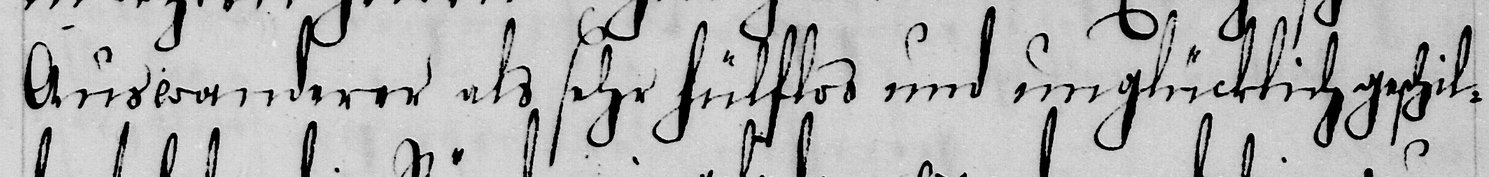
Auswanderer als sehr hülflos und unglücklich gesch¬
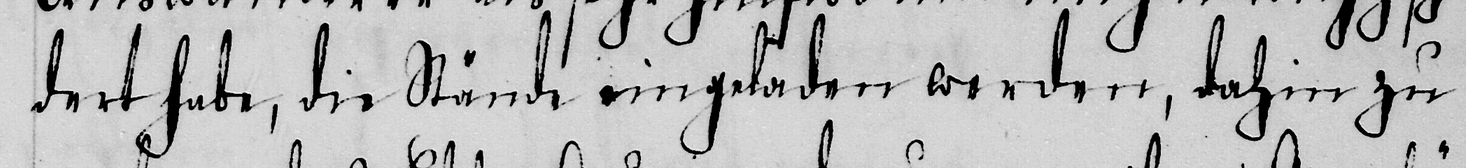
dert habe, die Stände eingeladen werden, dahin zu
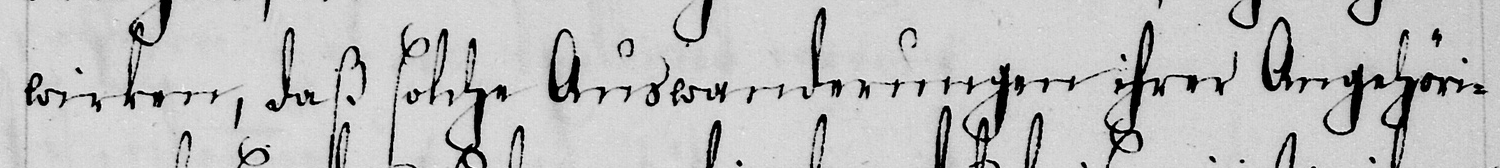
wirken, daß solche Auswanderungen ihrer Angehöri¬
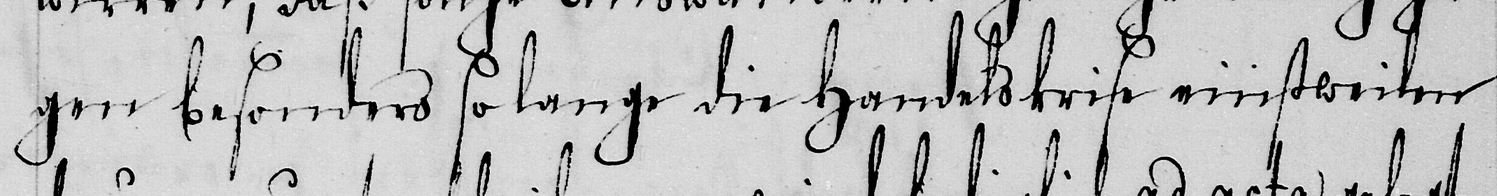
gen besonders so lange die Handelskrise einstweilen
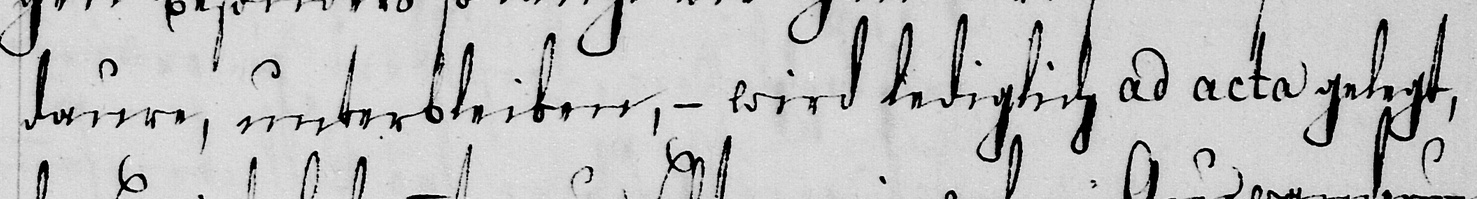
daure, unterbleiben, – wird lediglich ad acta gelegt,
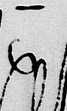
11.
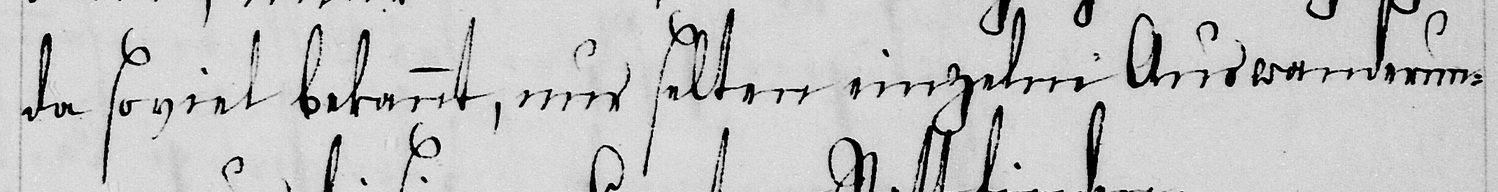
da soviel bekannt, nur selten Auswanderun¬
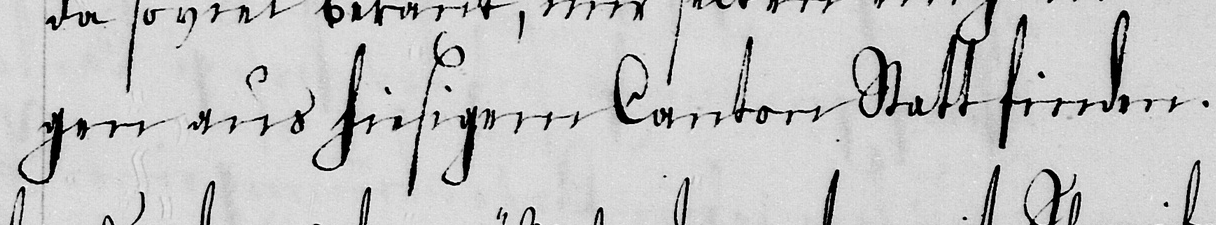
gen aus hiesigem Canton Statt finden.
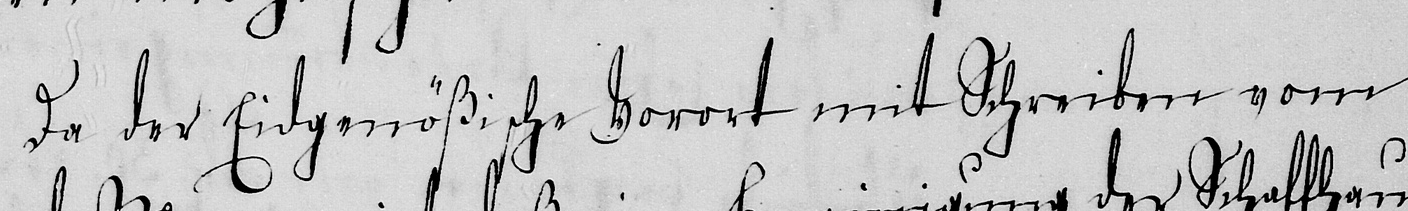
Da der Eidgenößische Vorort mit Schreiben vom
